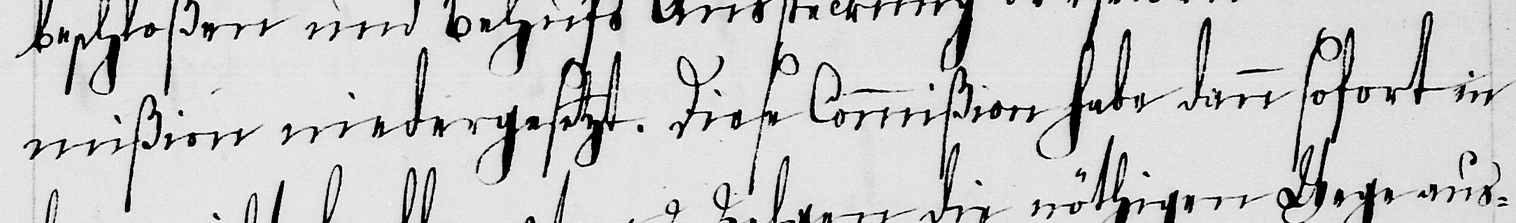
mißion niedergesetzt. Diese Commißion habe dann sofort in
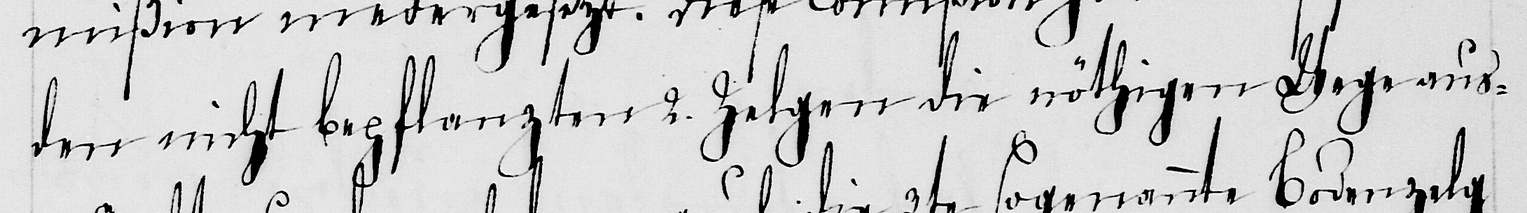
den nicht bepflanzten 2. Zelgen die nöthigen Wege aus¬
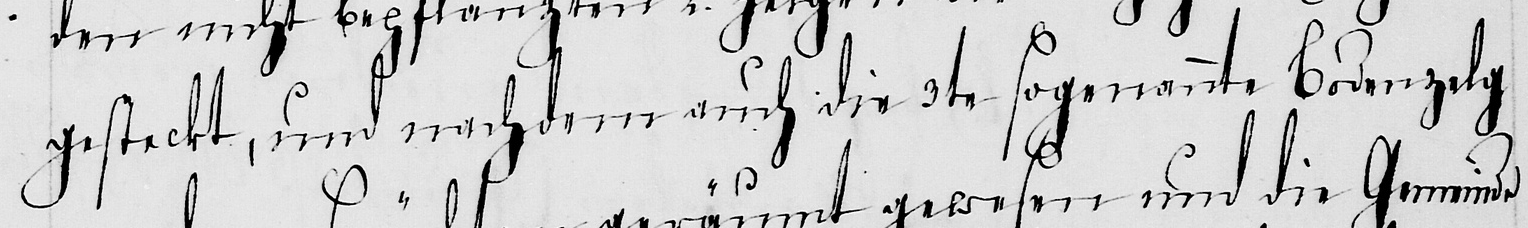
gesteckt, und nach dem auch die 3te sogenannte Bodenzelg
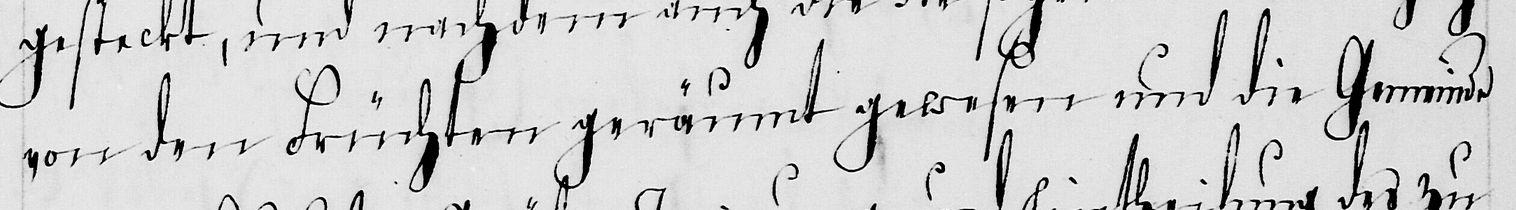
von den Früchten geräumt gewesen und die Gemeinde
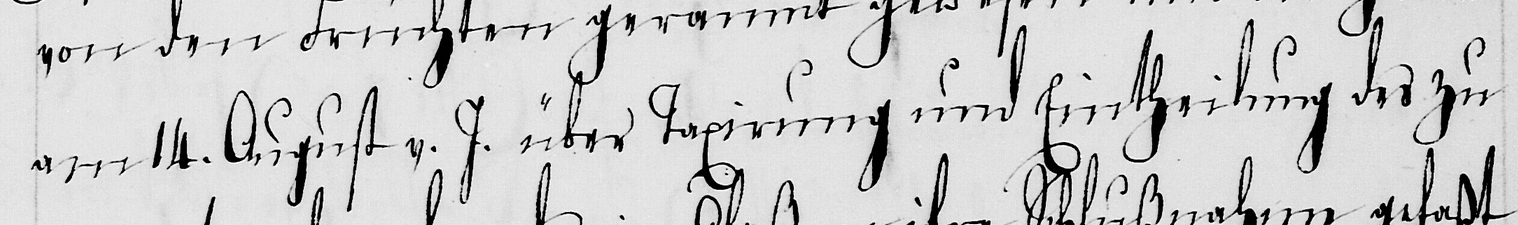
am 14. August v. J. über Taxirung und Eintheilung des zu
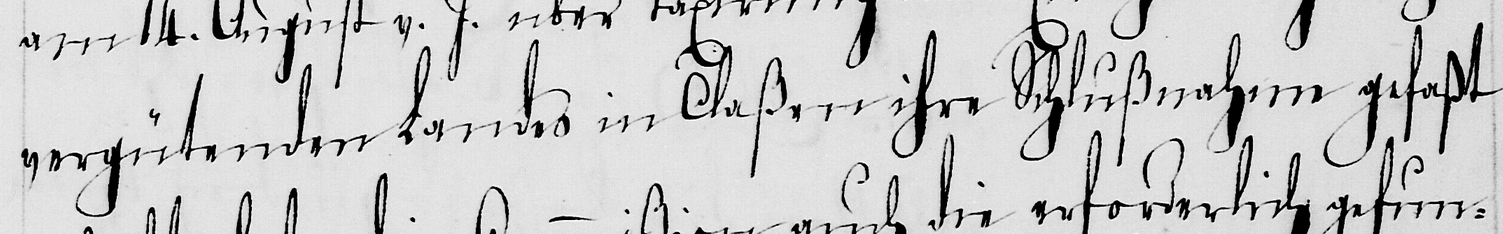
vergütenden Landes in Claßen ihre Schlußnahme gefaßt
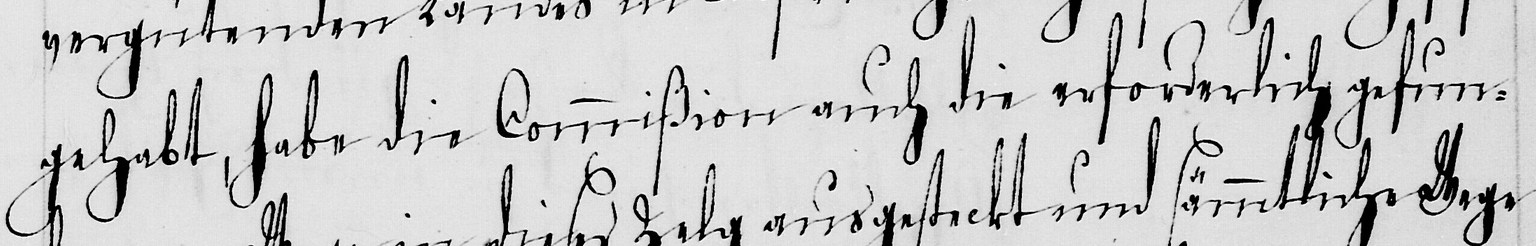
gehabt, habe die Commißion auch die erforderlich gefun¬
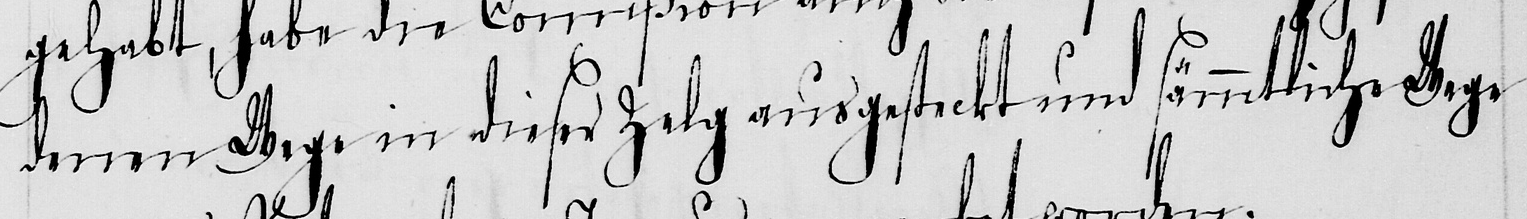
denen Wege in dieser Zelg ausgesteckt und sämmtliche Wege
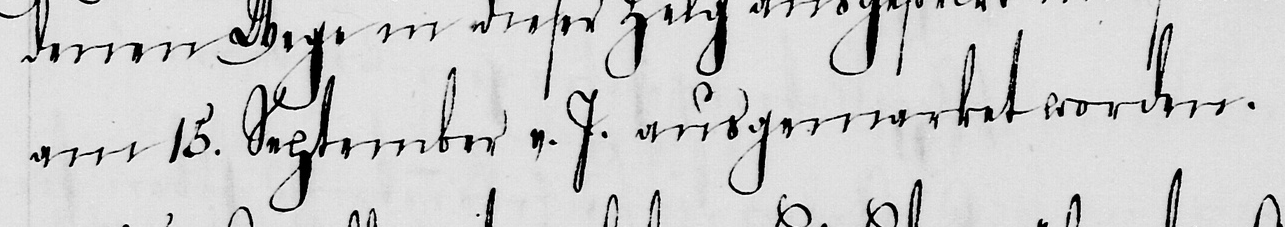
am 15. September v. J. ausgemarket worden.
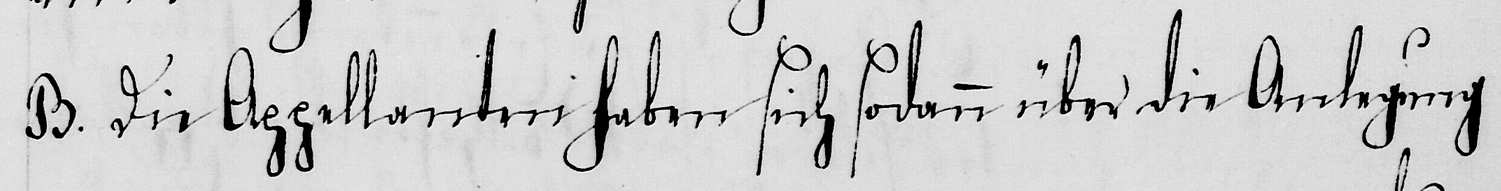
B. Die Appellanten haben sich sodann über die Anlegung
